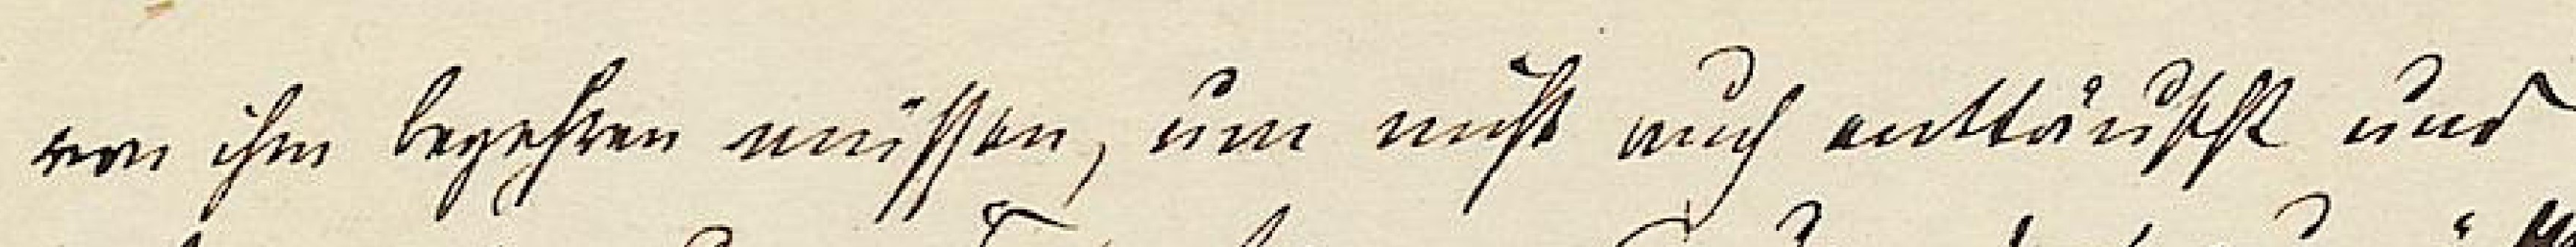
von ihm begehren müssen, um nicht auch enttäuscht und
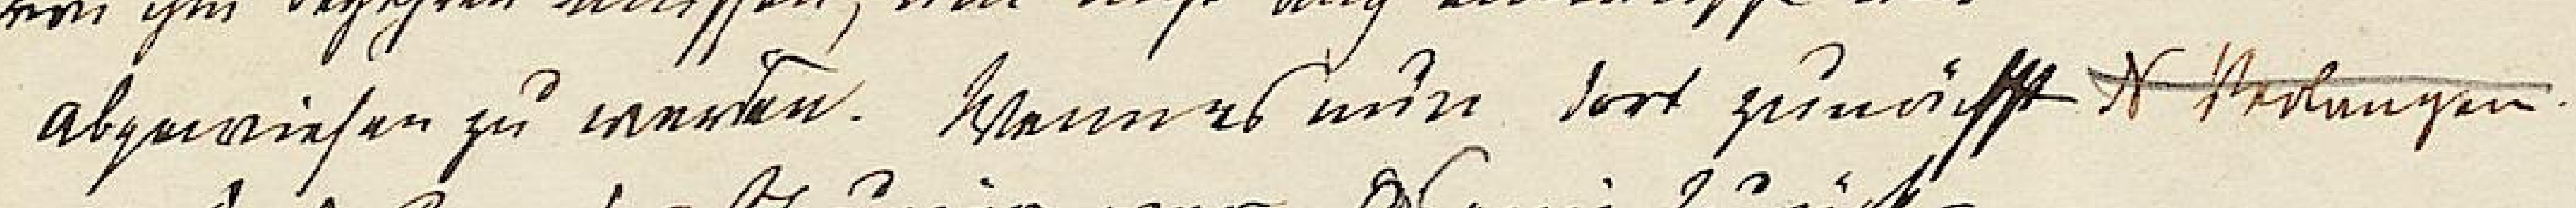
abgewiesen zu werden. Wenn es nun dort zunächst das Verlangen
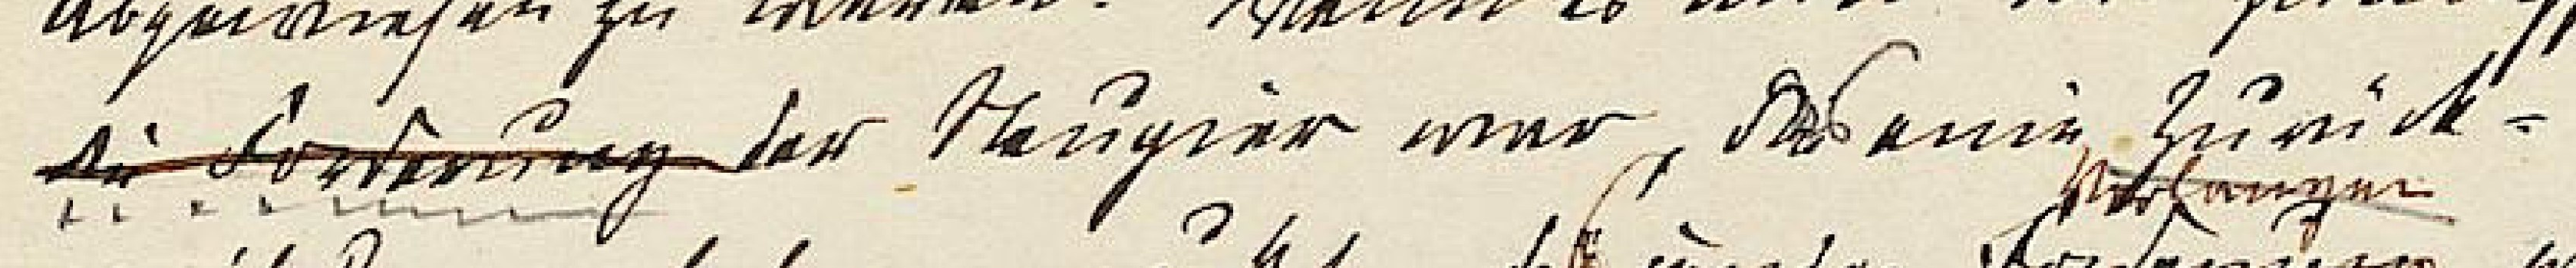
die Forderung der Neugier war, das eine Zurück¬
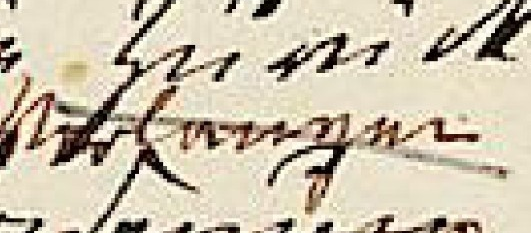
Verlangen
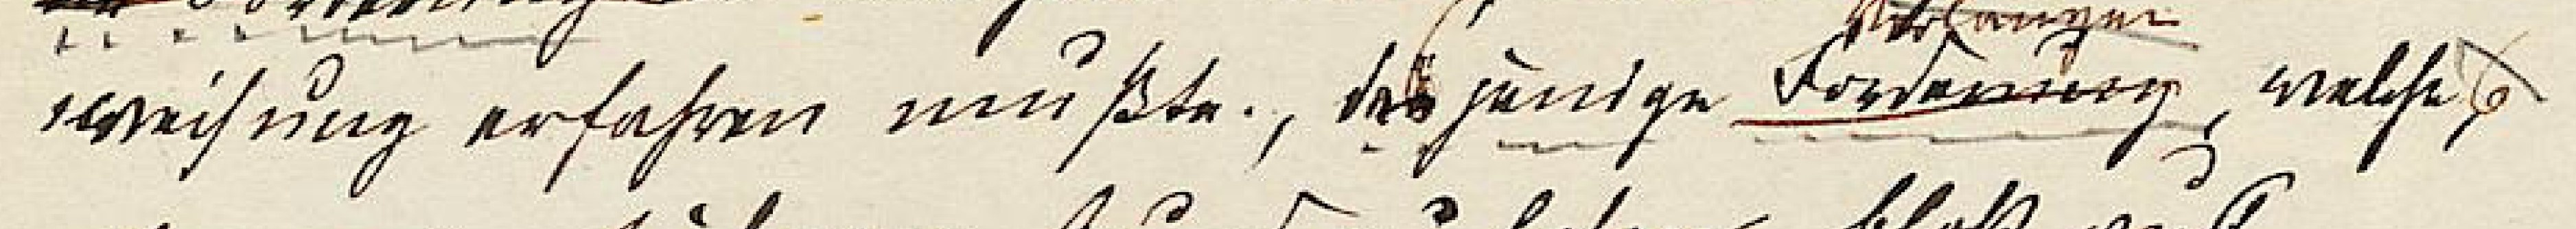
weisung erfahren musste, das jenige Forderung, welche's
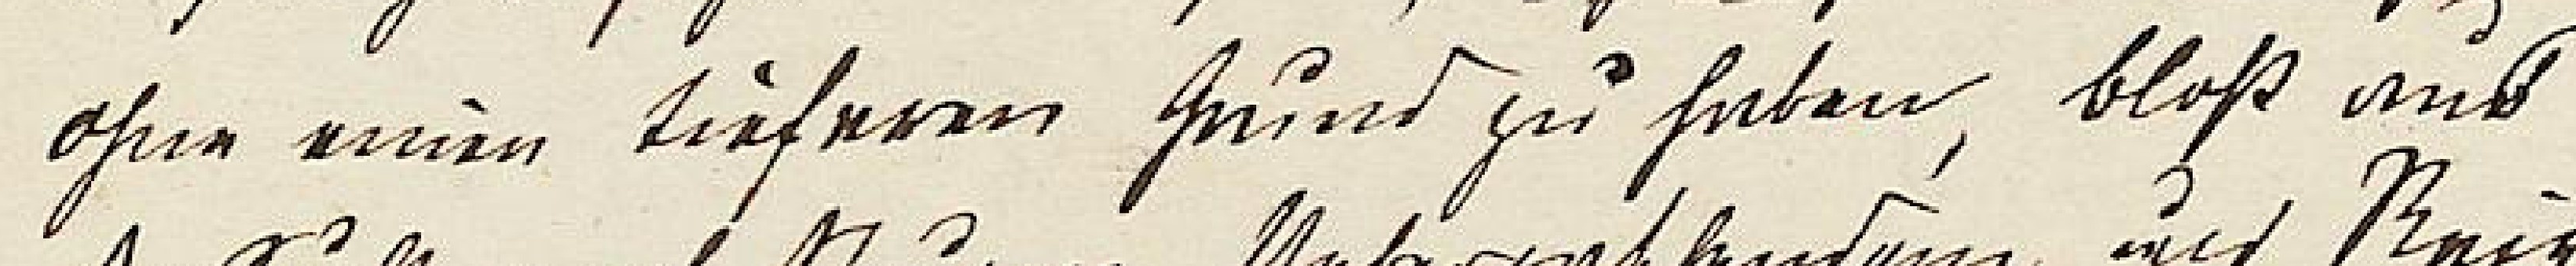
ohne einen tieferen Gund zu haben, bloß aus
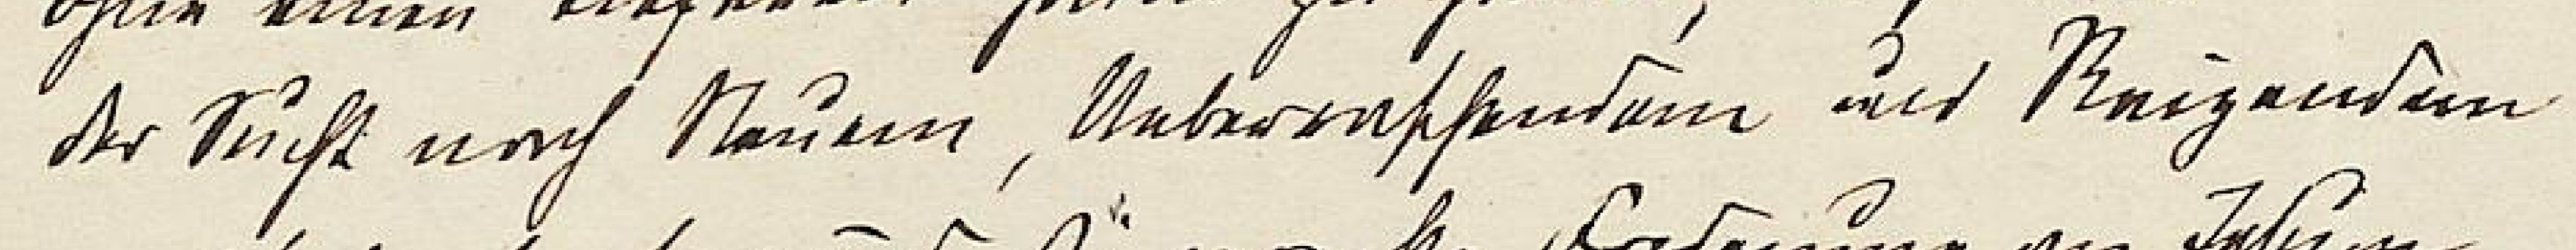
der Sucht nach Neuem, Ueberraschendem und Reinigendem
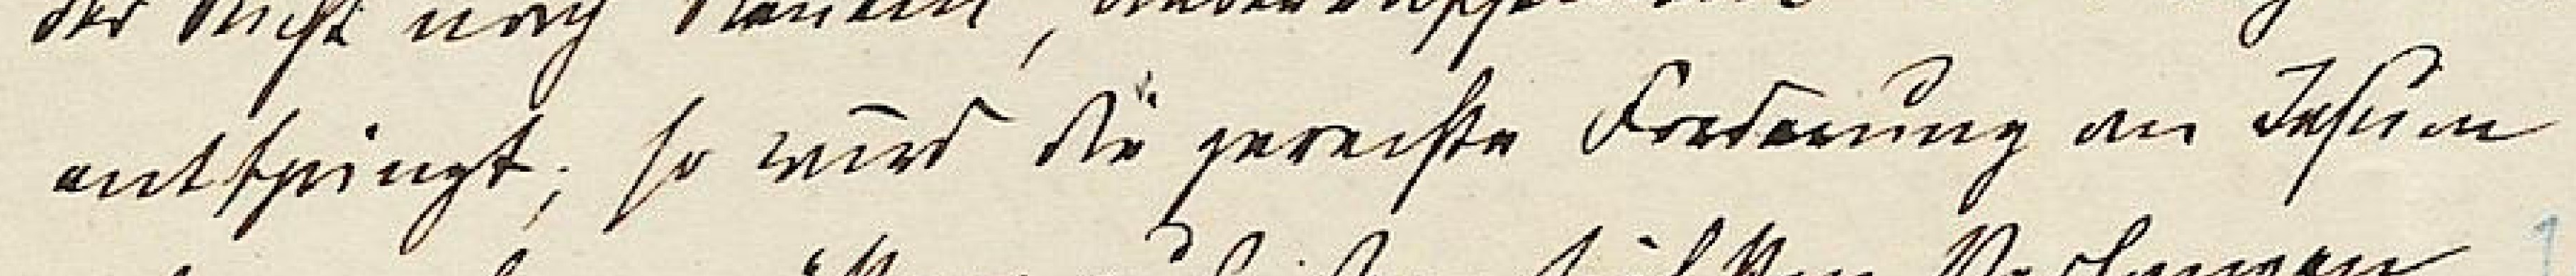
entspringt, so wird die gerechte Forderung an Jesum
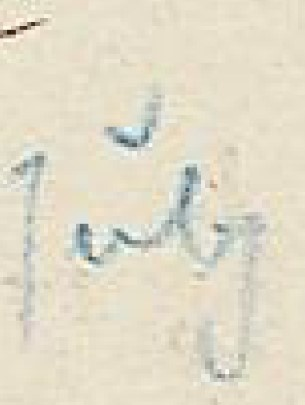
ubg.
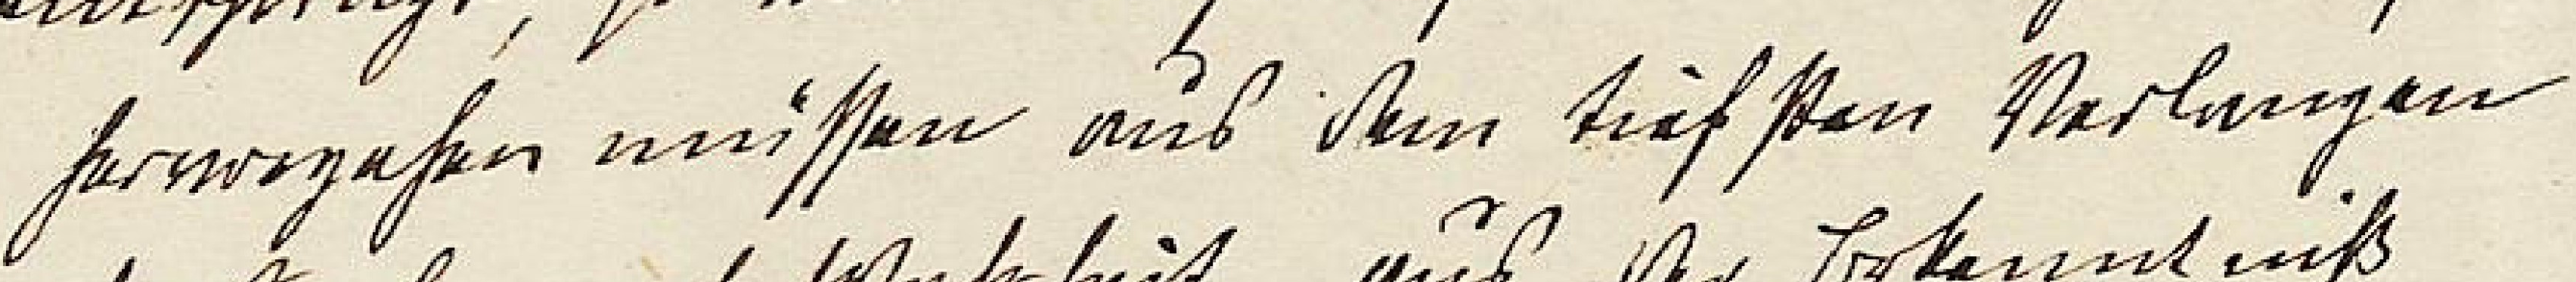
hervorgehen müssen aus dem tiefsten Verlangen
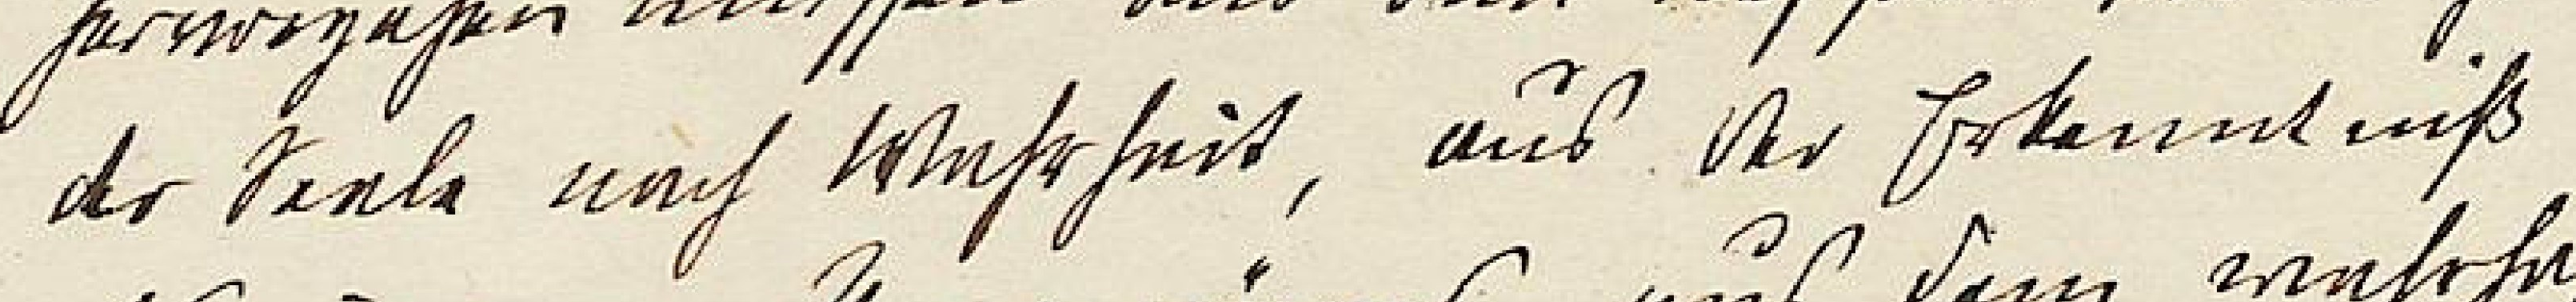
der Seele nach Wahrheit, aus der Erkenntniß
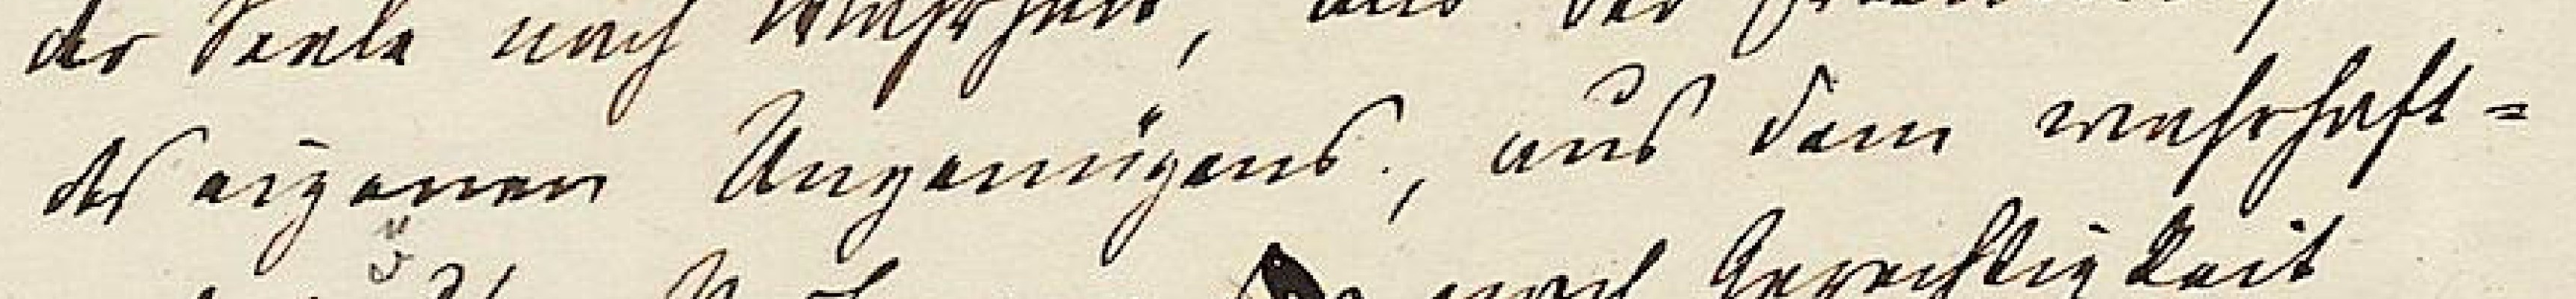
des eigenen Ungenügens, aus dem wahrhaft¬
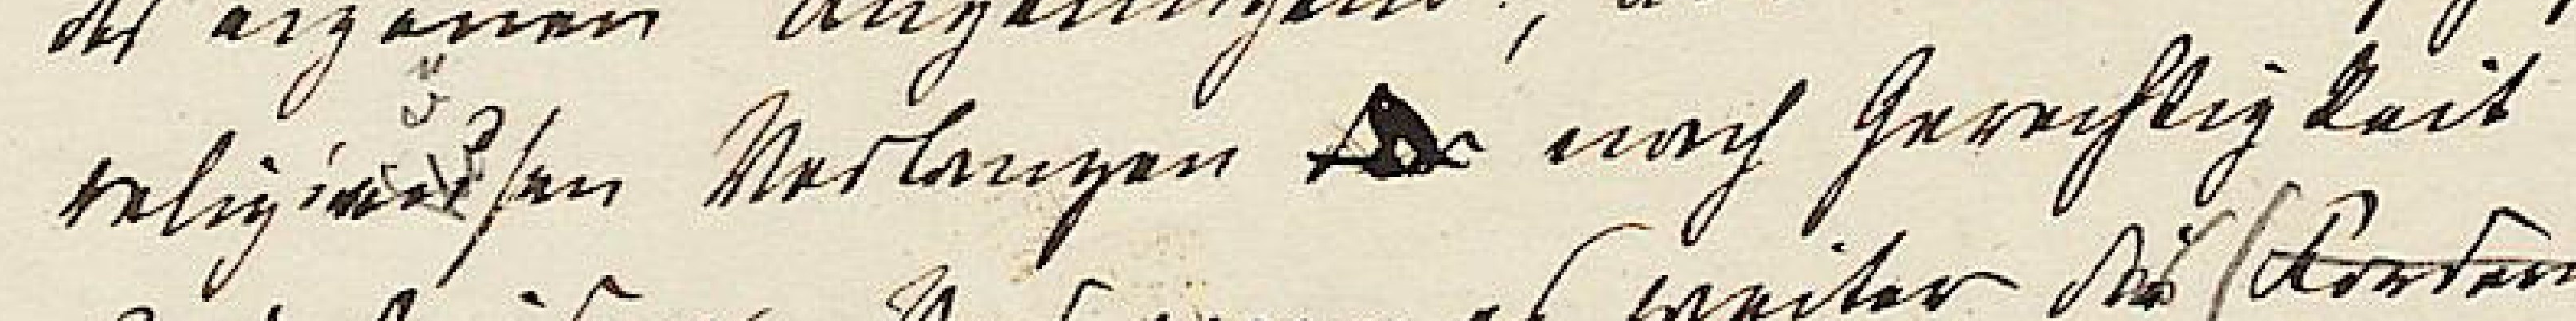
religieusen Verlangen der nach Gerechtigkeit
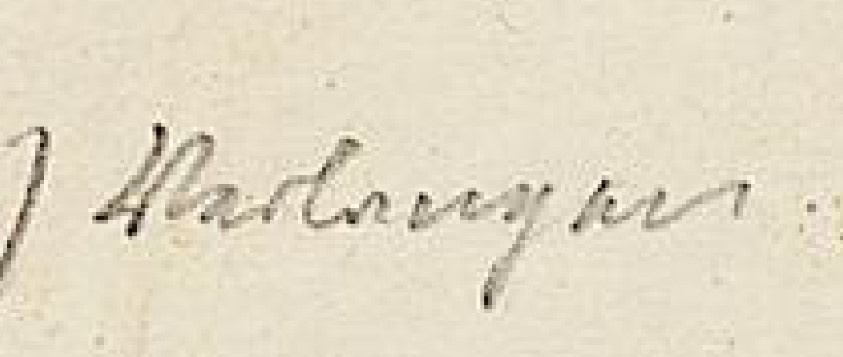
V Verlangen.
